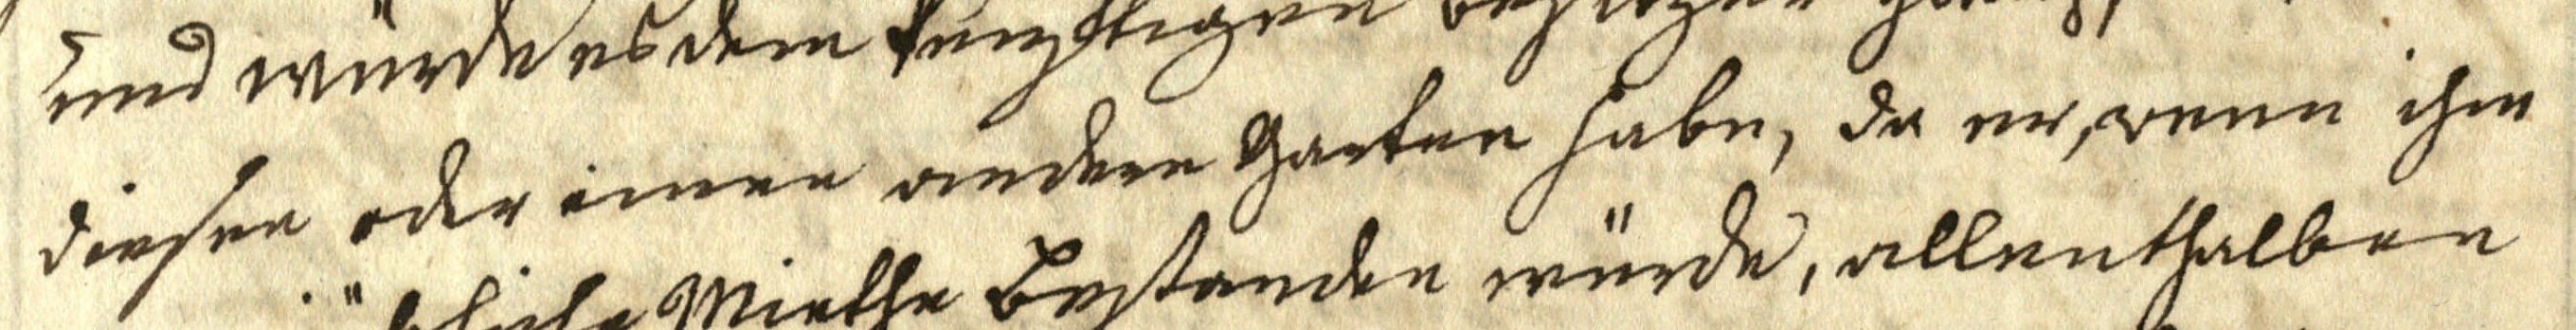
diesen oder einen andern Garten habe, da , wenn ihm
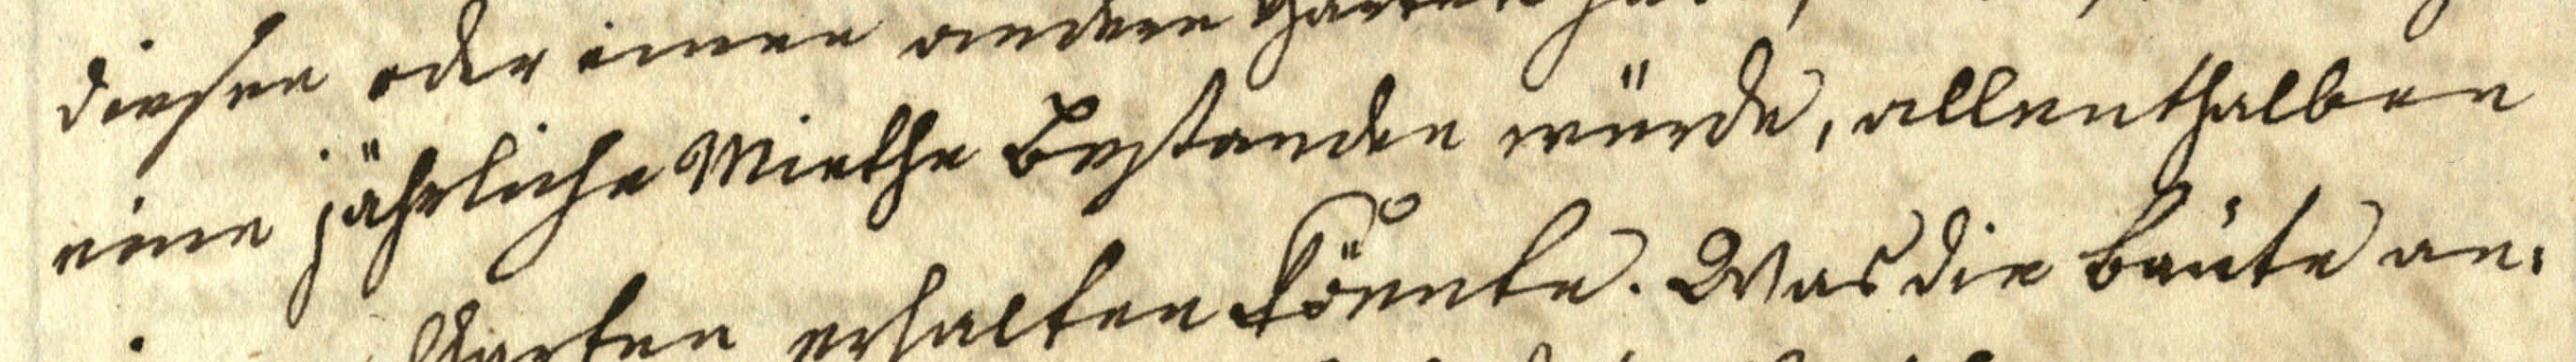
eine jährliche Miethe bestanden würde, allenthalben
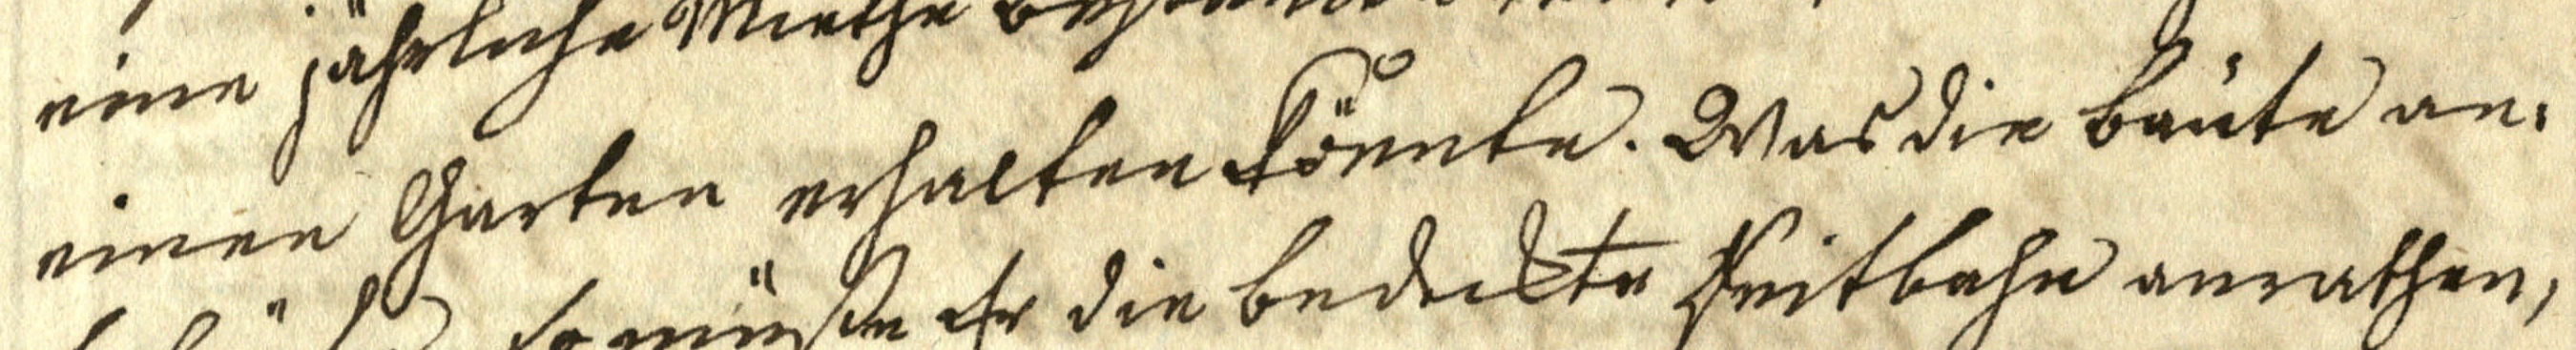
einen Garten erhalten könnte. Was die Baute an¬
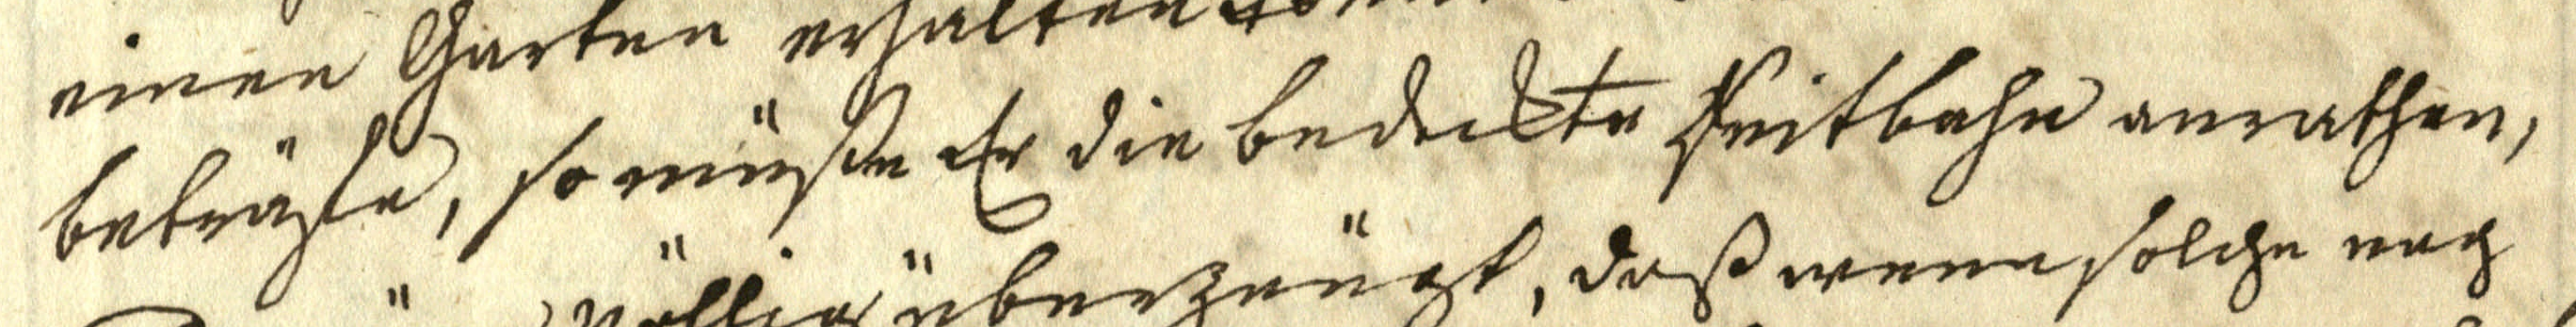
beträfe, so müße Er die bedeckte Reitbahn anrathen,
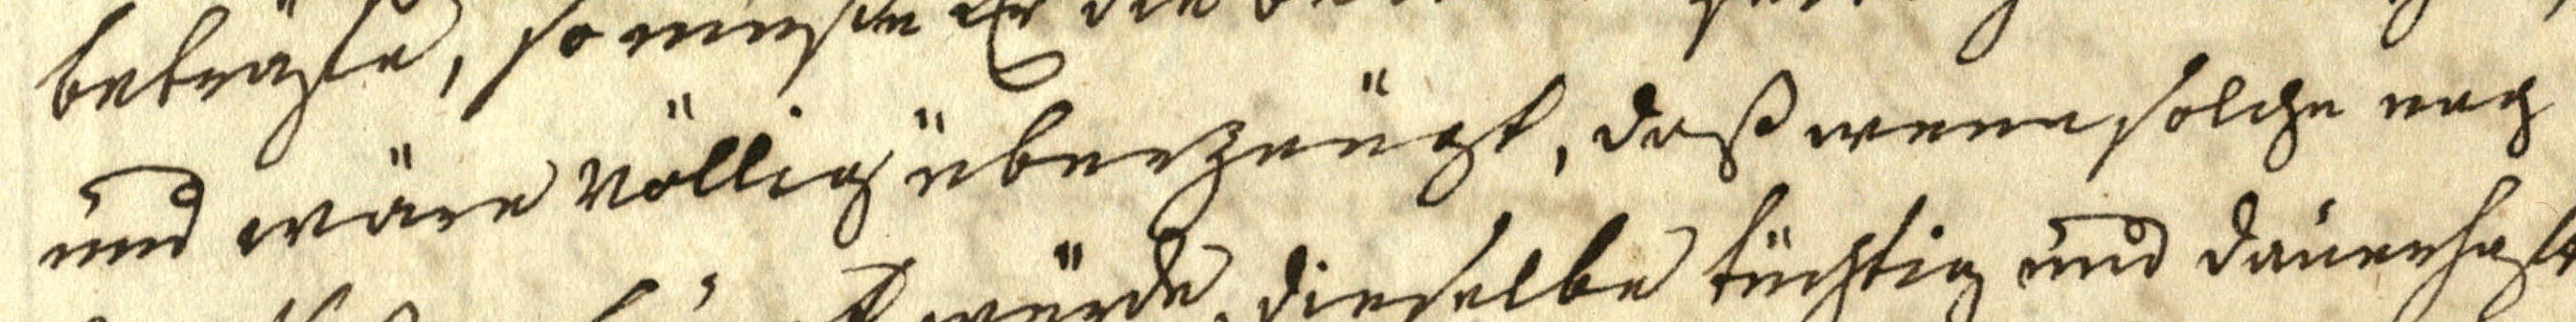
und wäre völlig überzeugt, daß wenn solche nach
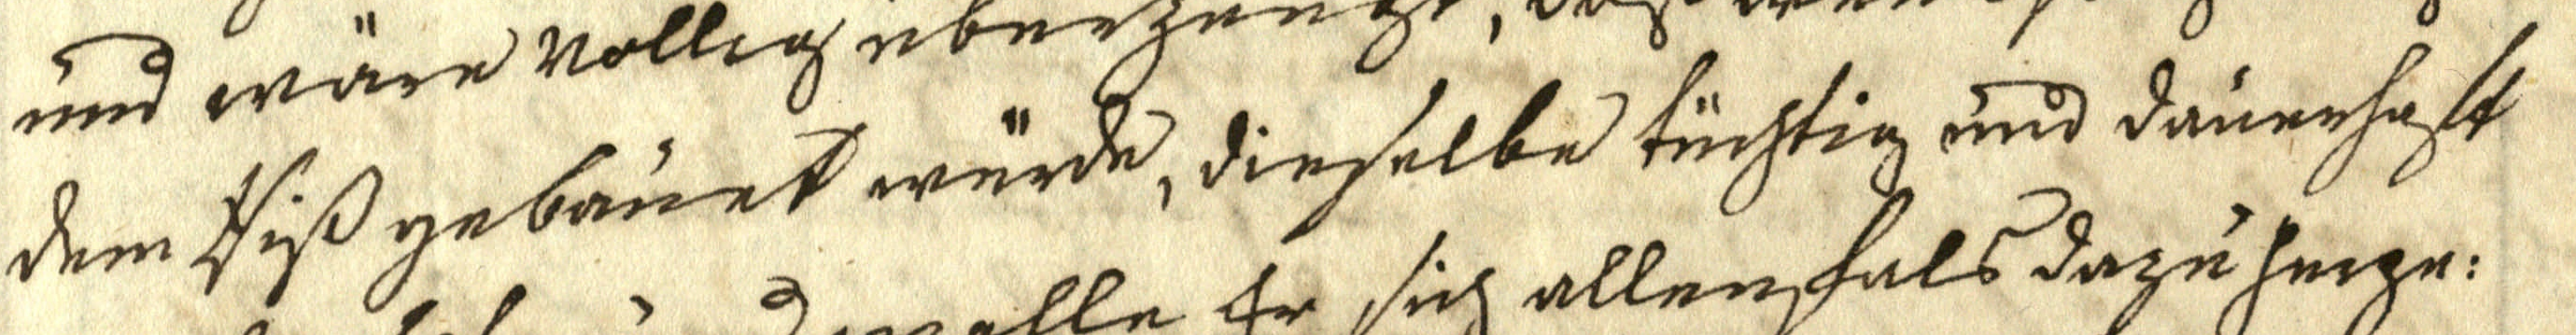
dem Riß gebauet würde, dieselbe tüchtig, und dauerhaft
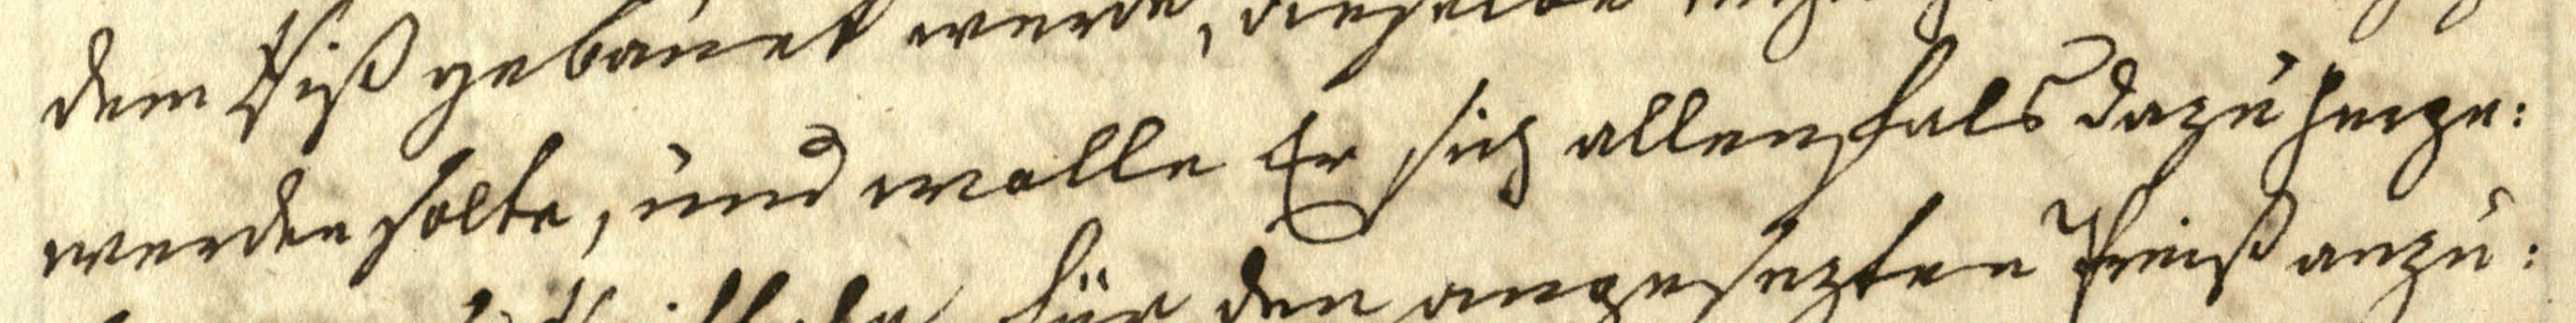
werden solte, und wolle Er sich allenfals dazu herge¬
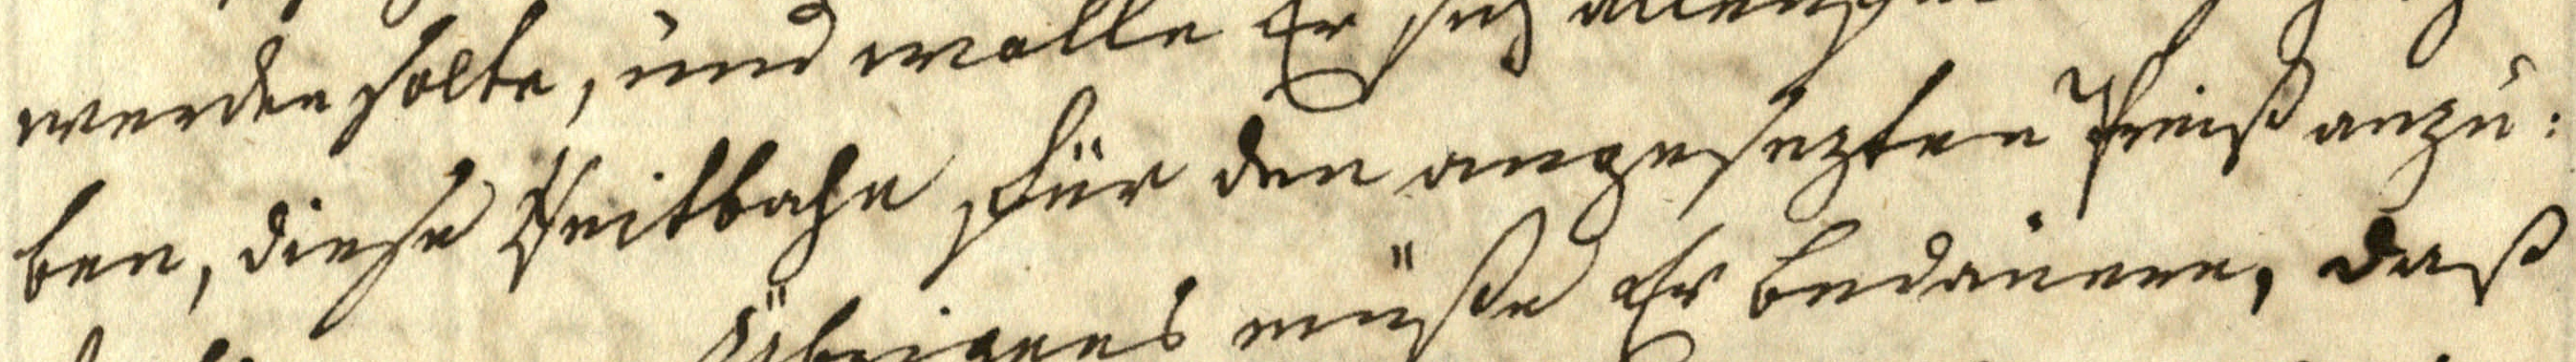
ben, diese Reitbahn für den angesezten Preis anzu¬
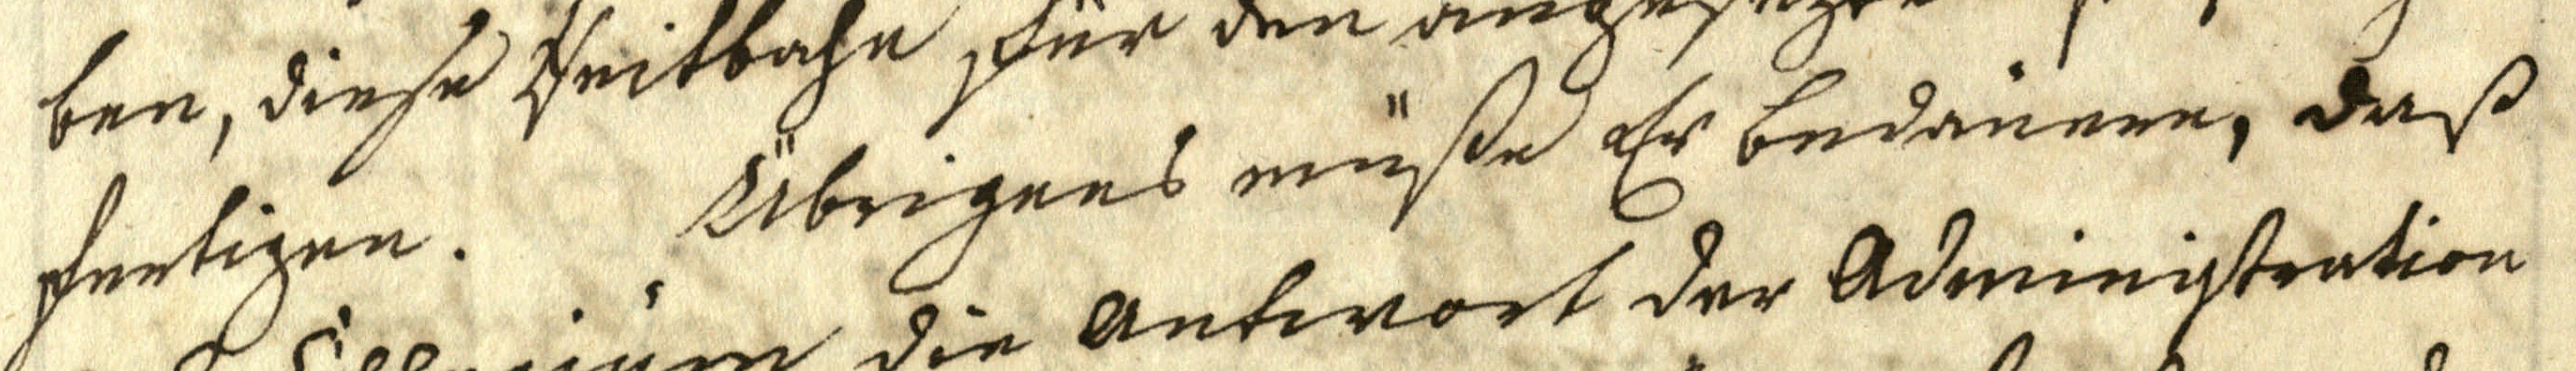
fertigen. Übrigens müße Er bedauern, daß
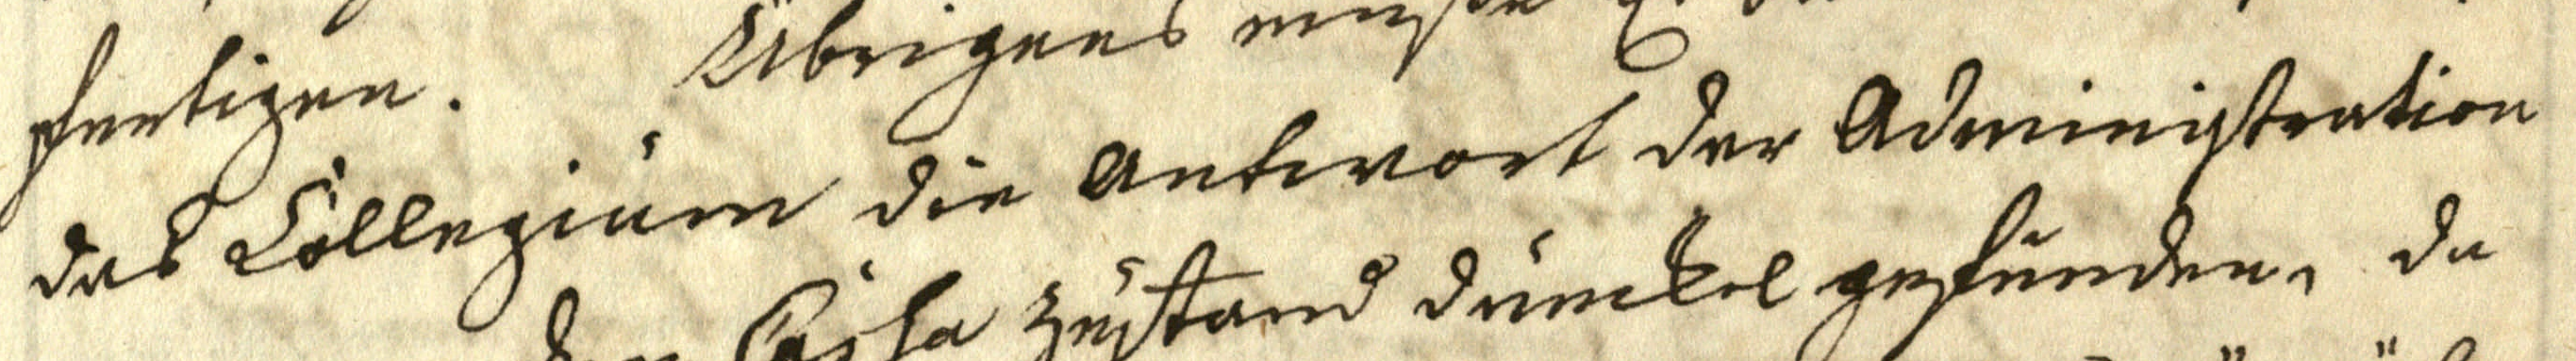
das Collegium die Antwort der Administration
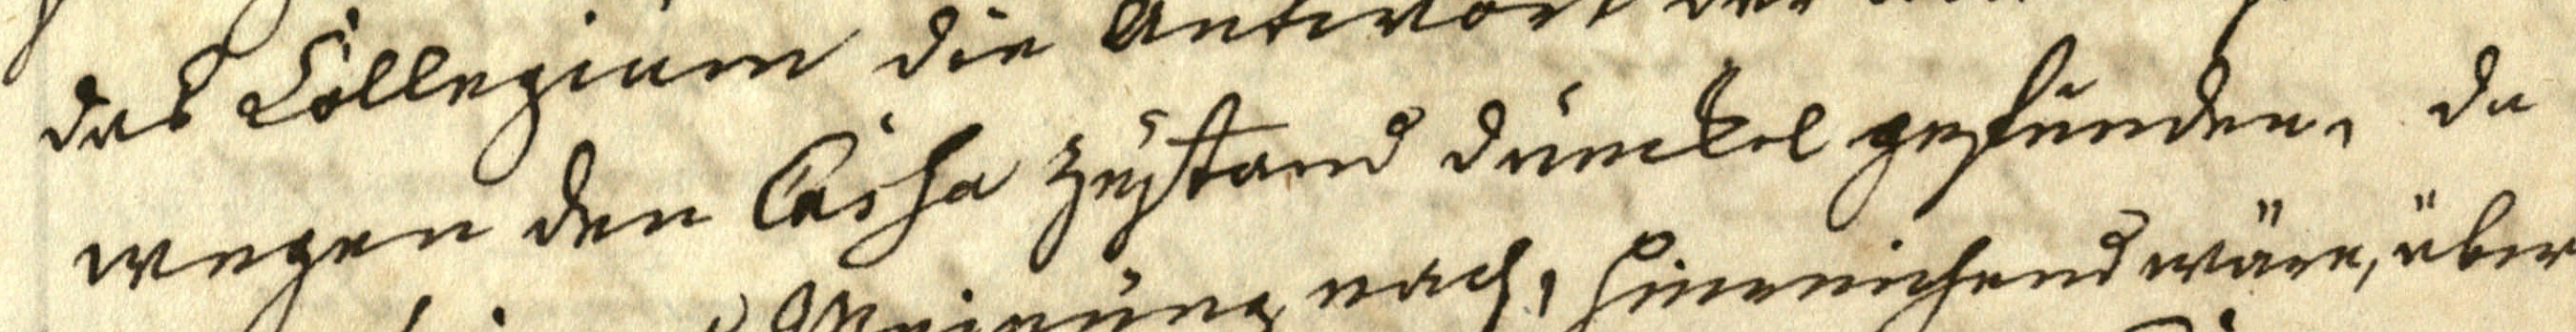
wegen den Cassa zustand dunckel gefunden, da
